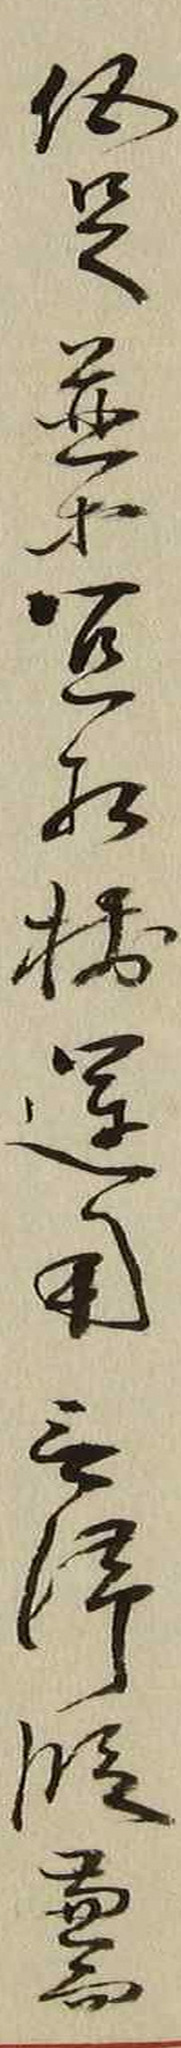伍足並等宜相揃運用無滞段兼而
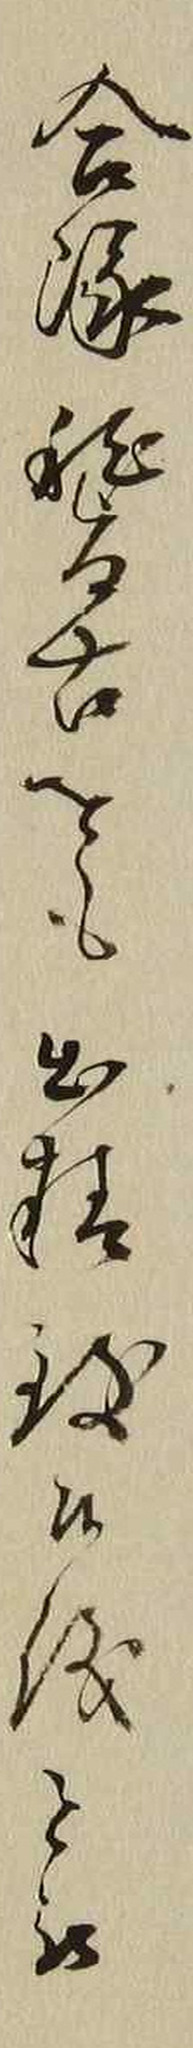合隊稽古をも出精致候儀と被
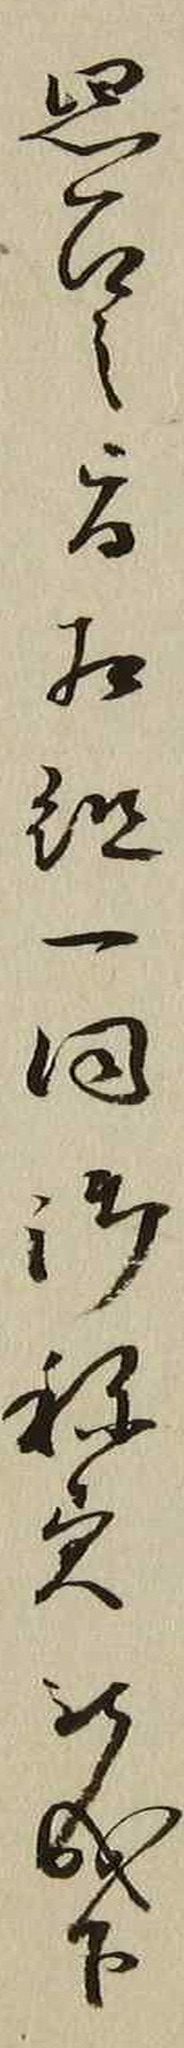思召の旨相組一同御称実被成下
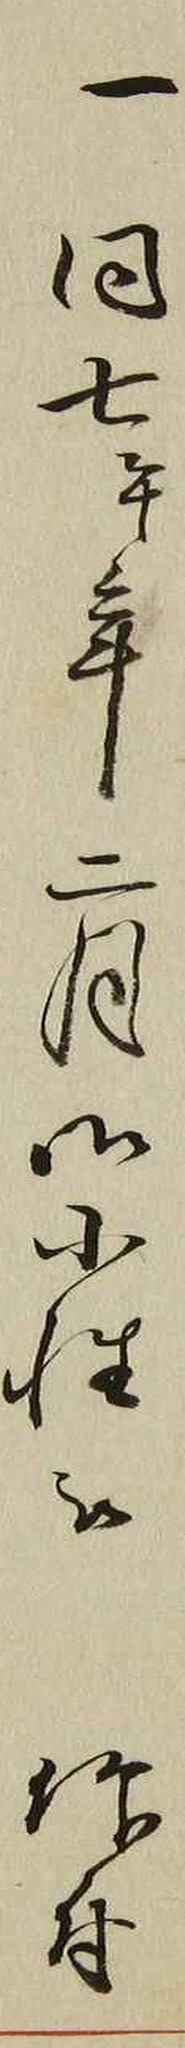一同七午年二月御小姓被仰付
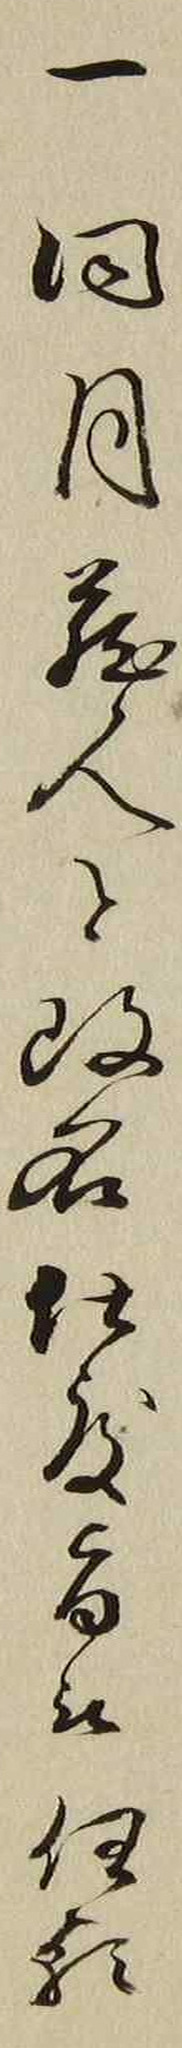一同年蔵人と改名仕度旨被任願
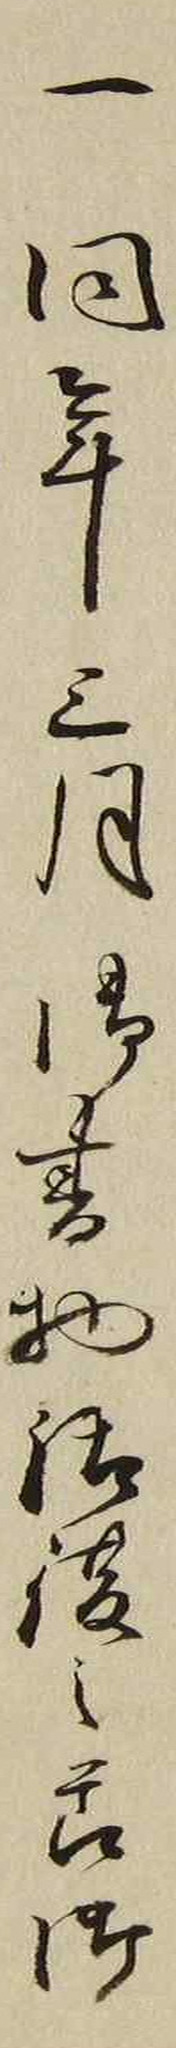一同年三月御書物御復の節御
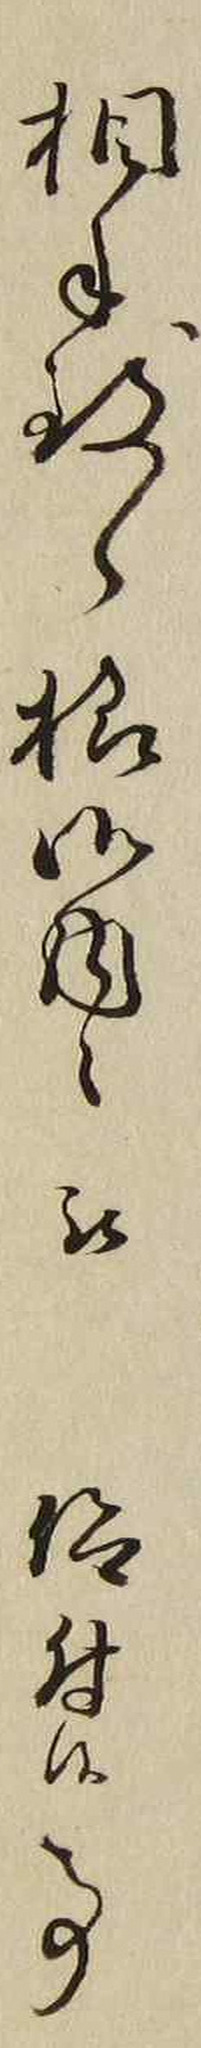相手致候様御内々被仰付候事
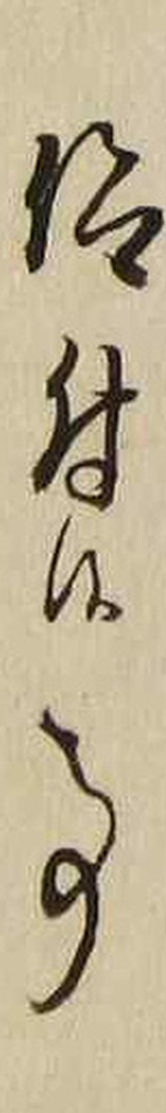仰出候事

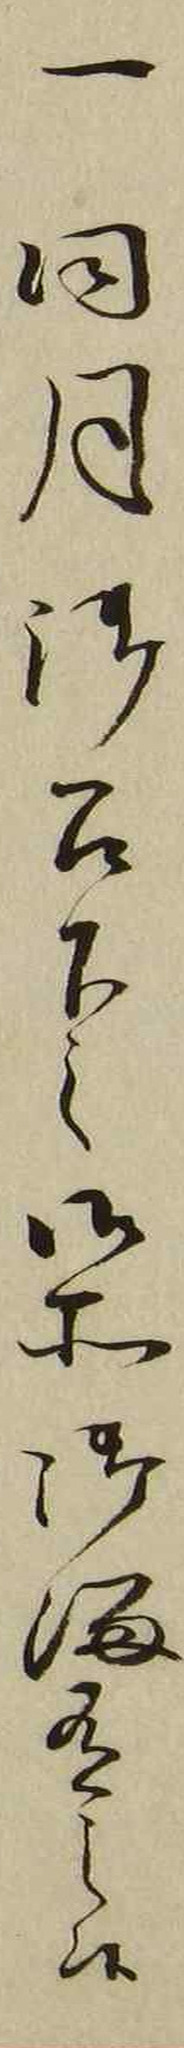一同月御召下の御品御溜有之候
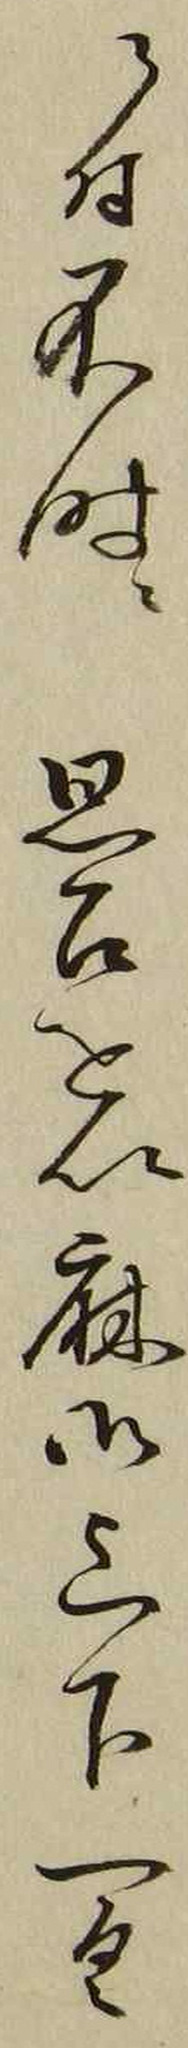に付不時に思召を以麻御上下一具
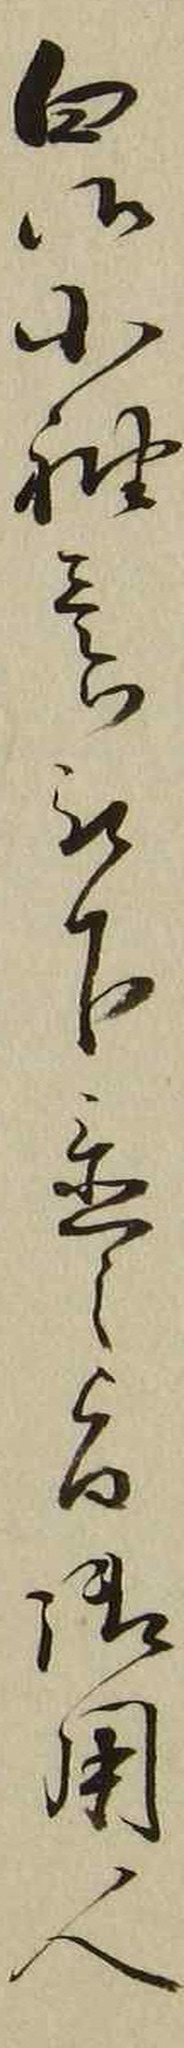白御小袖壱つ被下置の旨御用人
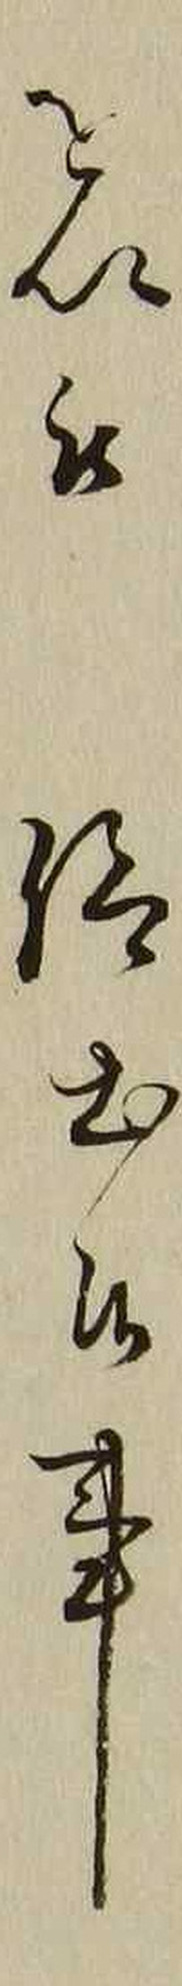を以被仰出候事
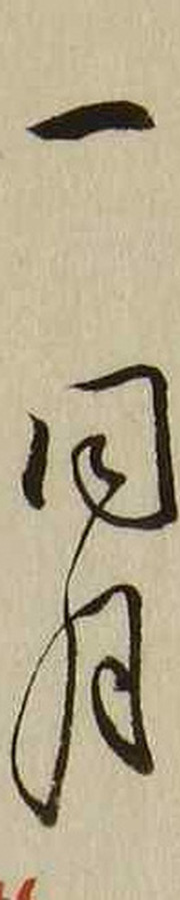一同月
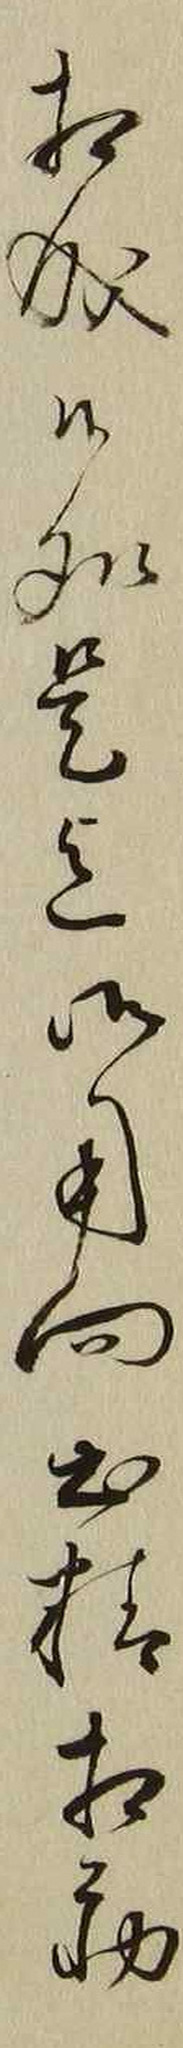相成候処是迄御用向出精相勤
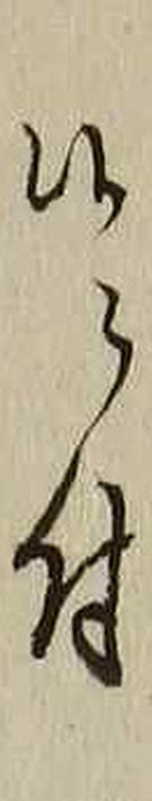候に付
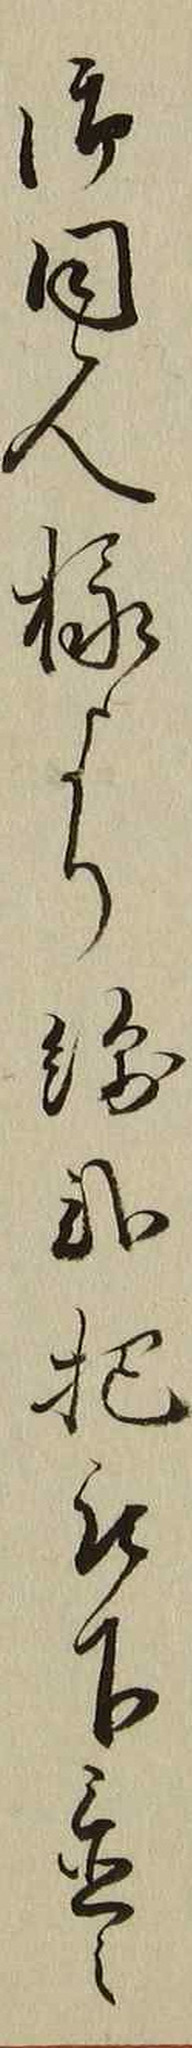御同人様より綿弐把被下置の
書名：諸士系譜　巻之1　い之部1
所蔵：会津若松市立会津図書館
